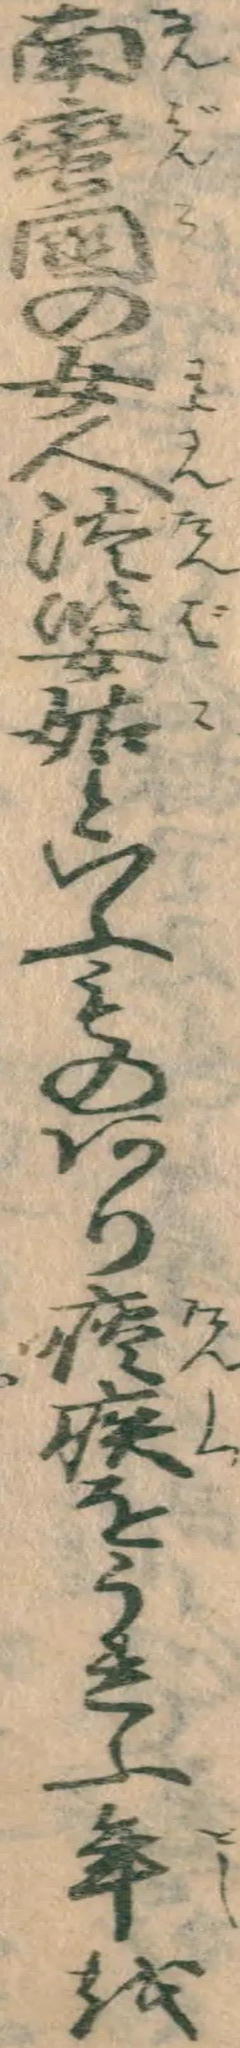南蛮国の女人淡婆姑といふものあり痰疾をうれふ年を
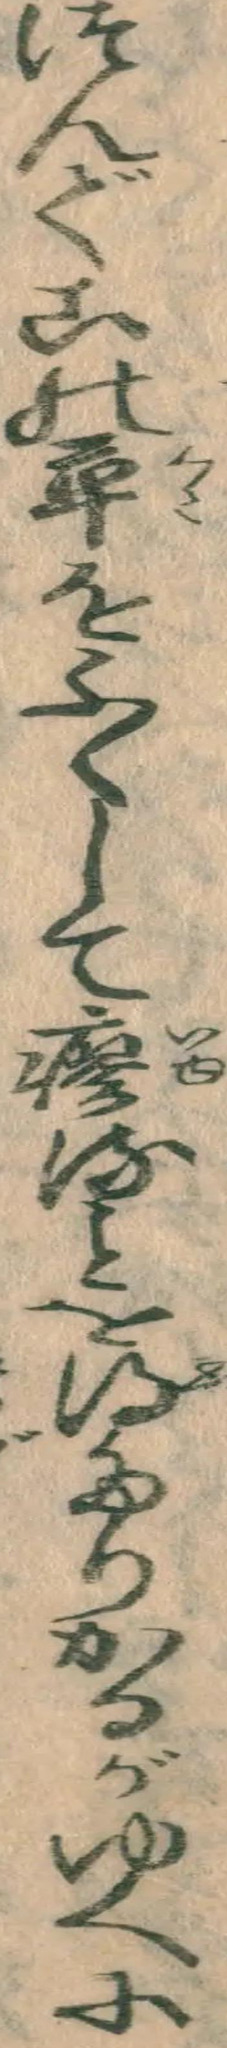つんでこの草をふくして瘳ることを得たりかるがゆへに
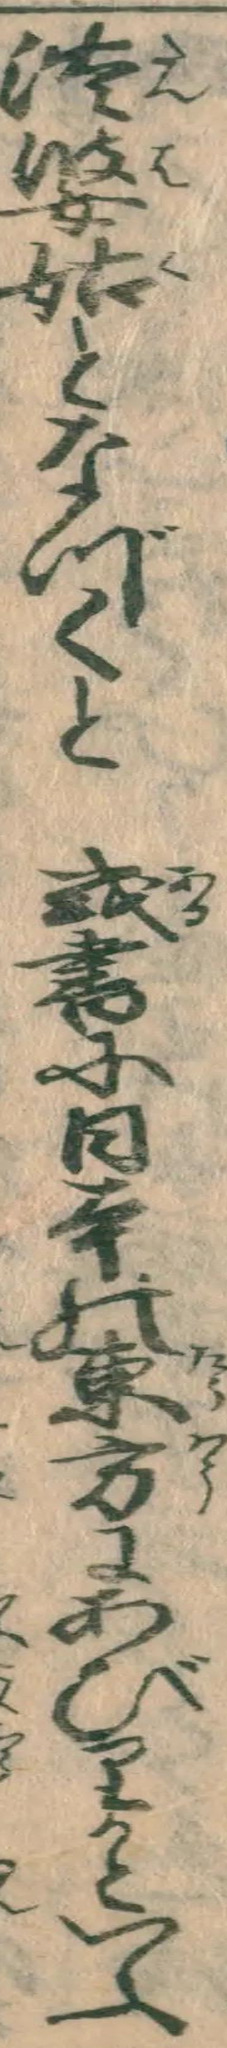淡婆姑となづくと或書に日本の東方にあびりかといふ
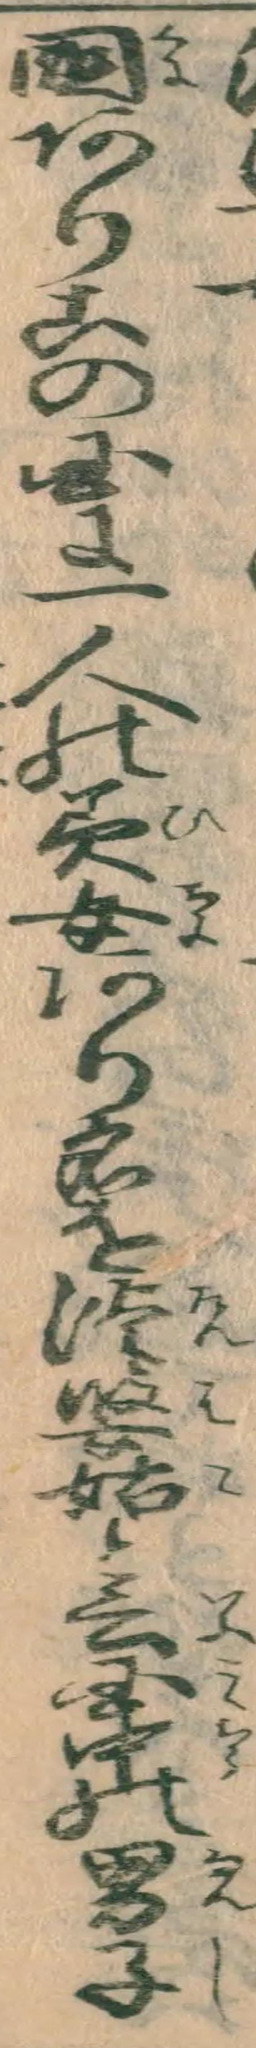国ありこの国に一人の美女あり名を淡婆姑と云国中の男子
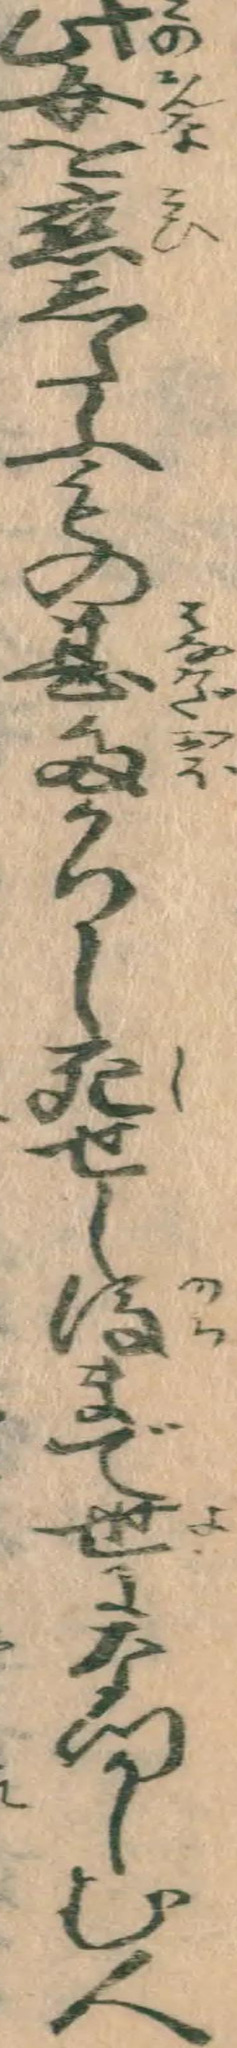此女を恋したふもの甚多かり死せし後まで世になつかしむ人
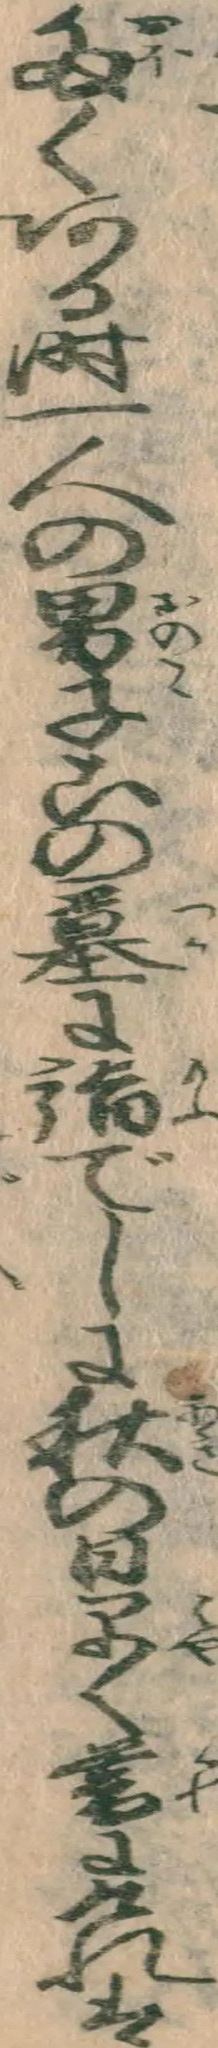多くある時一人の男子この墓に詣でしに秋の日早く暮にけれは
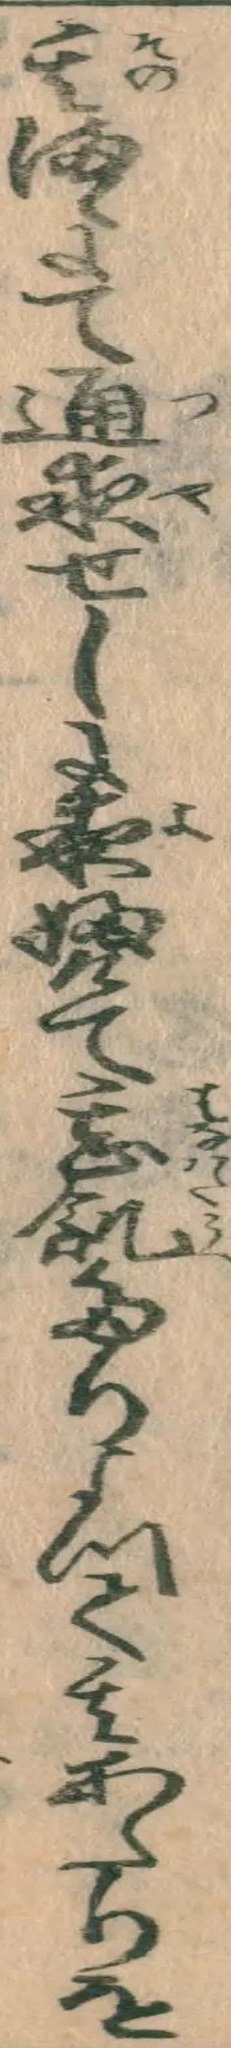其まゝにて通夜せしに夜ふけて甚飢たりよつて其あたりを
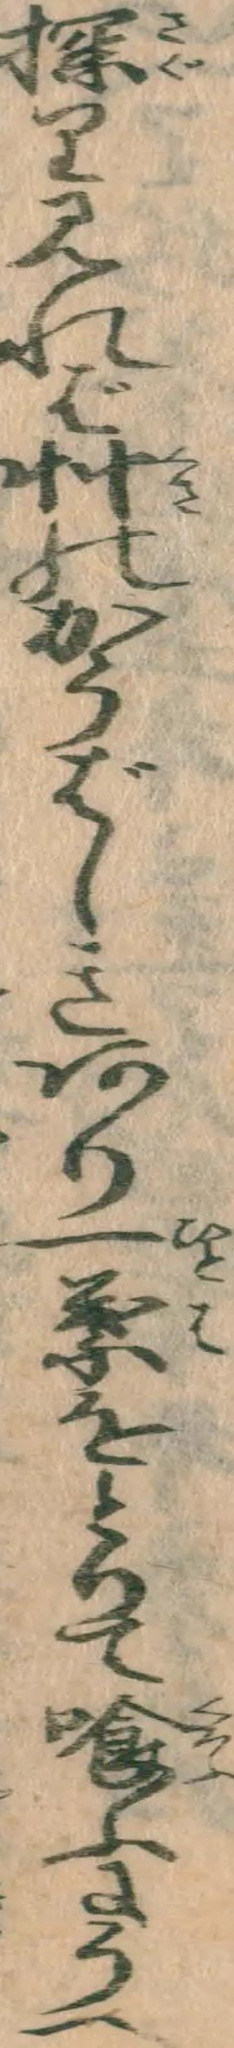探り見れば草のかうばしきあり一葉をとりて喰ふにうへ
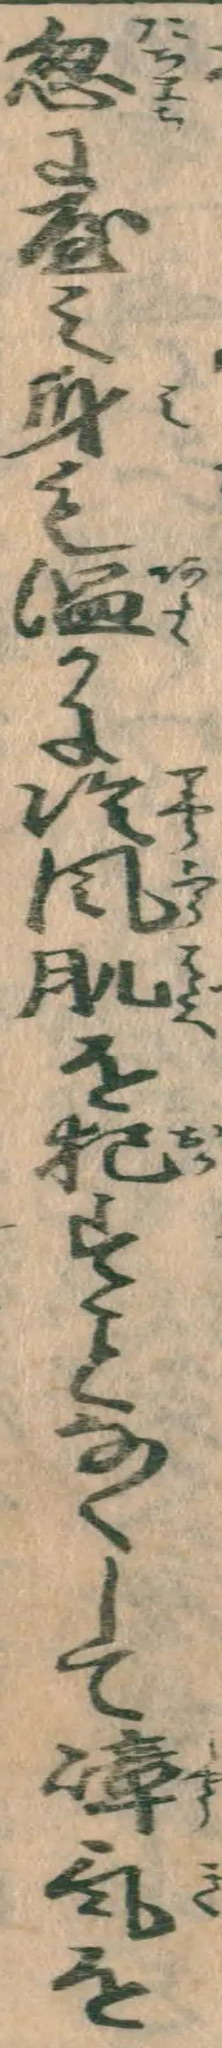忽にやみ身も温かに冷風肌を犯すことなくして嶂気を
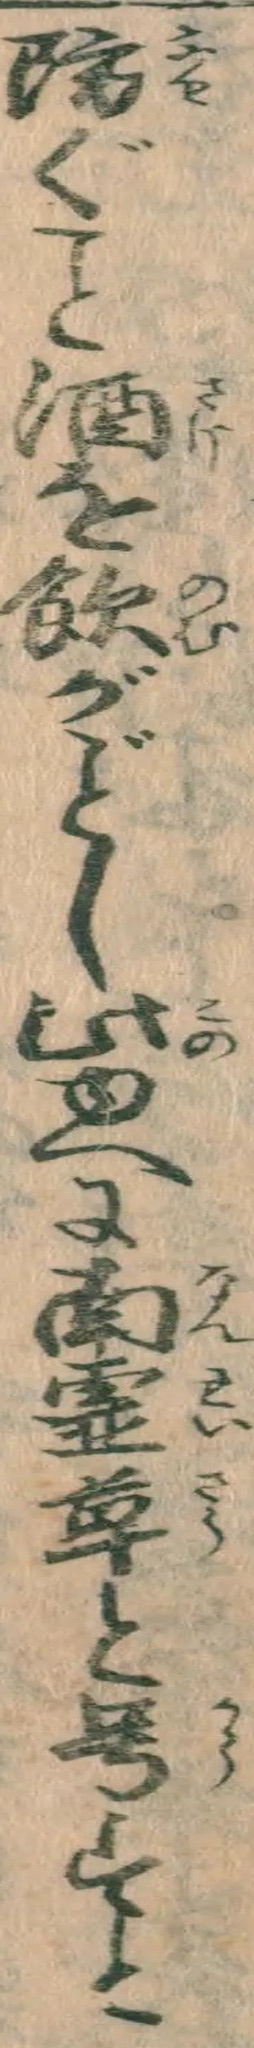防ぐこと酒を飲がごとし此ゆへに南霊草と号すと
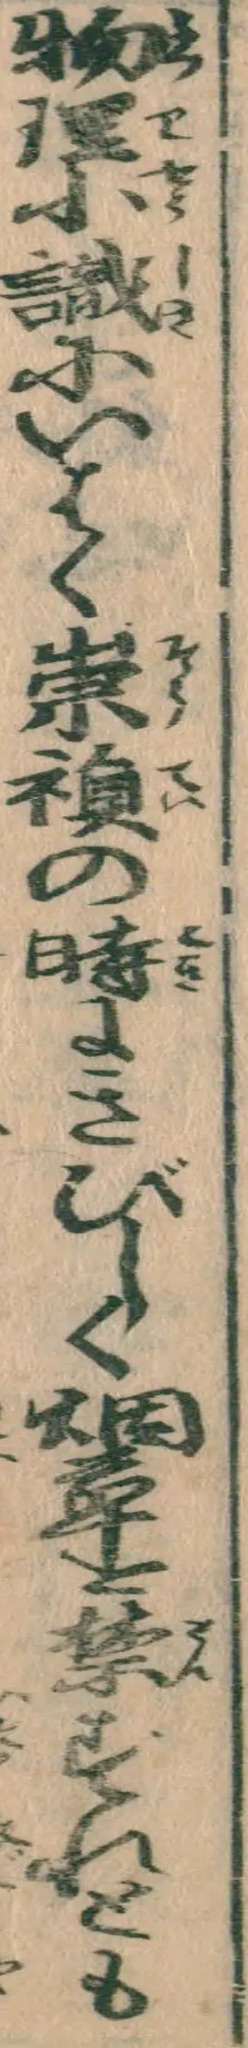物理小識にいはく崇禎の時にきびしく烟草を禁ずれとも
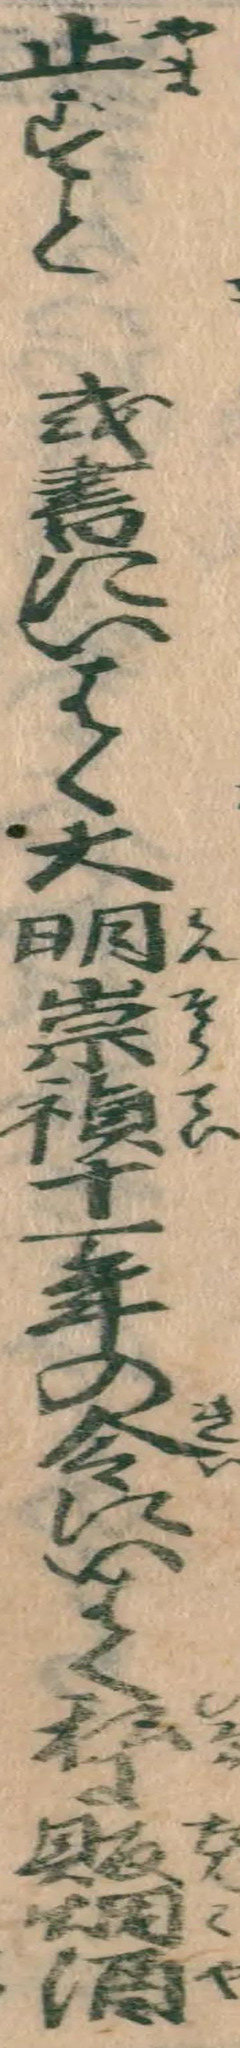止ずと或書にいはく大明崇禎十一年の令にいはく私に販烟酒
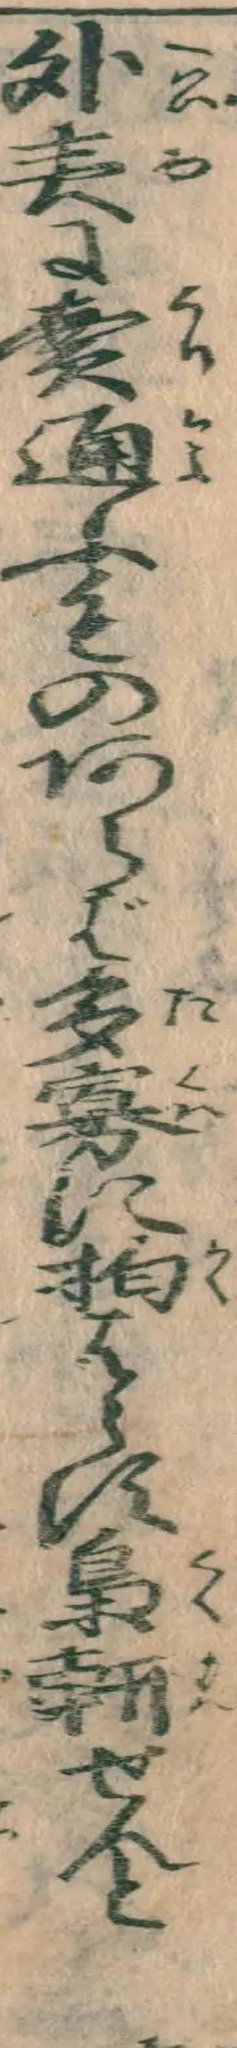外夷に売通ふものあらば多寡に拘はらす梟斬せんと博
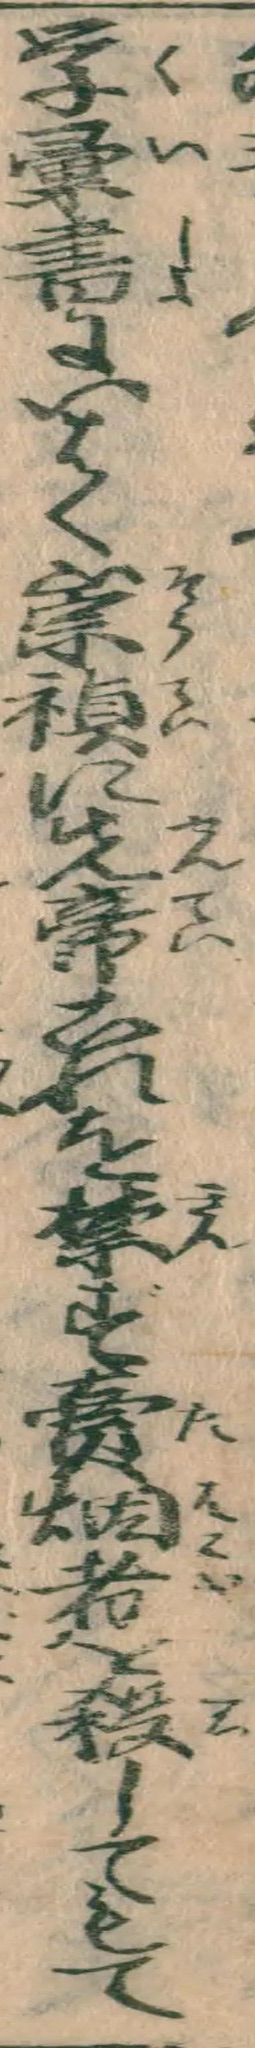学彙書にいはく崇禎に先帝これを禁ず売烟者を殺してもて
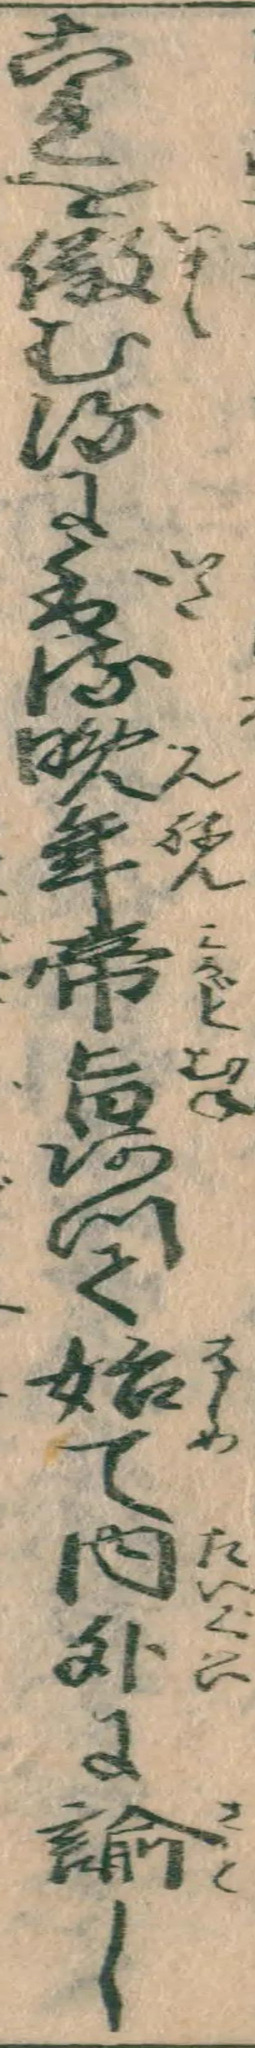これを儆むるに至る晩年帝旨あつて始て内外に諭し
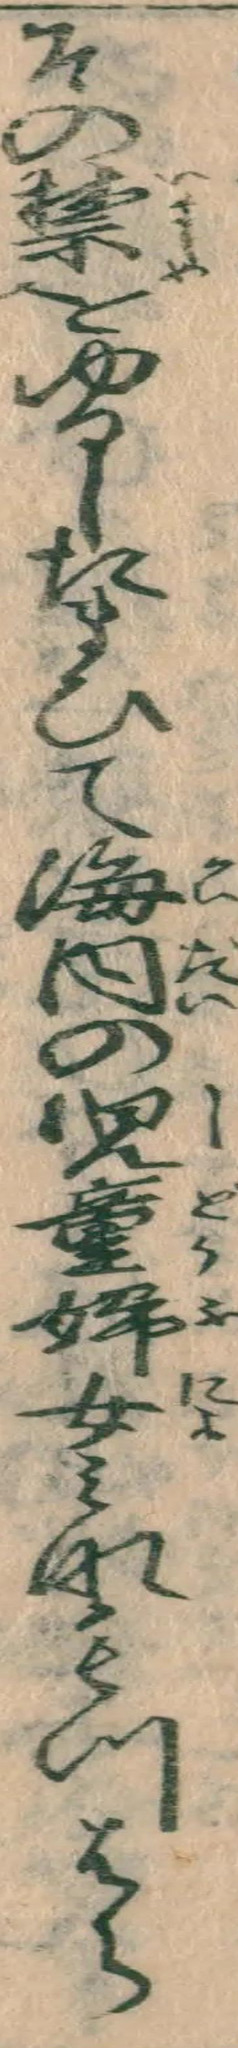その禁をゆるしたまひて海内の児童婦女みなもつはら
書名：煙草記
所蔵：国立国会図書館 National Diet Library, JAPAN
